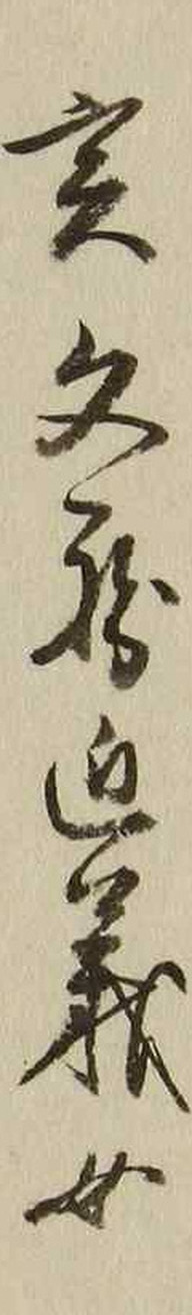実文蔵近義女
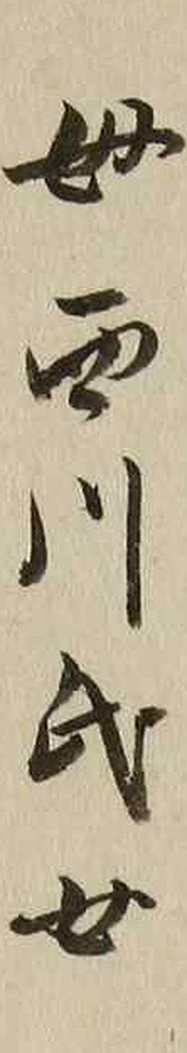母西川氏女
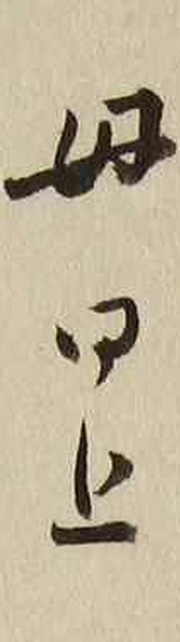母同上
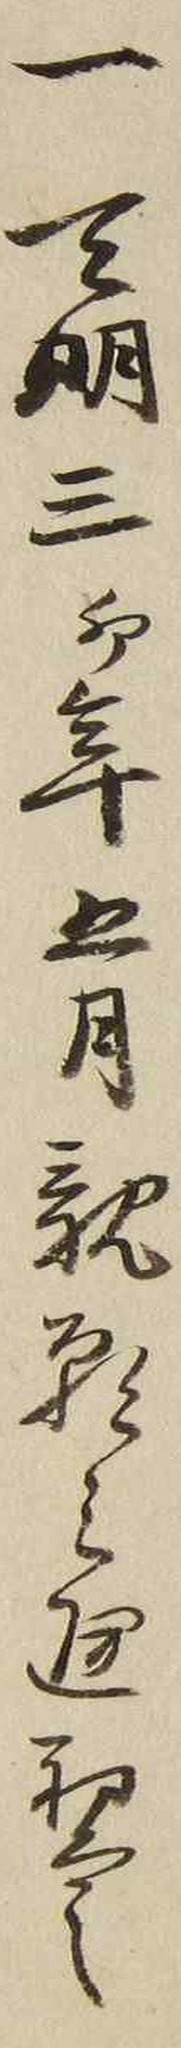一天明三卯年五月親願之通初而之
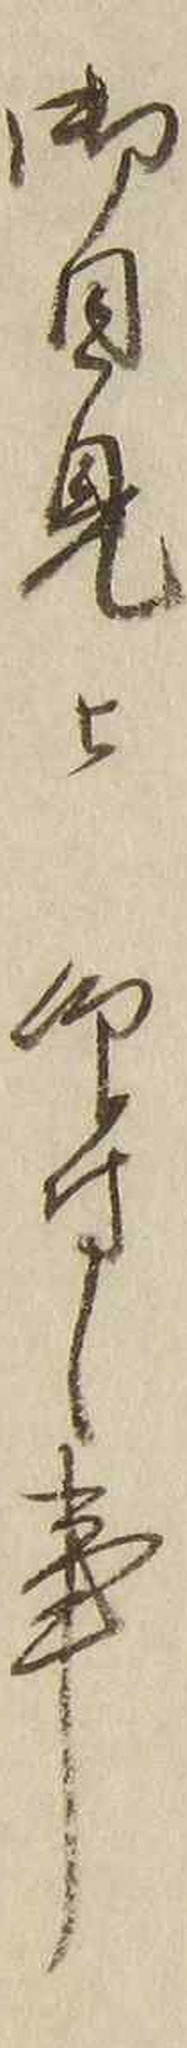御目見被仰付候事

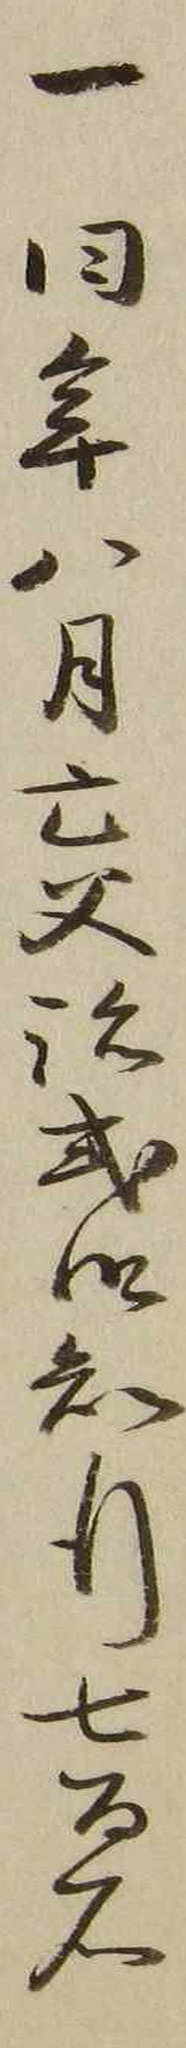一同年八月亡父跡式御知行七百石
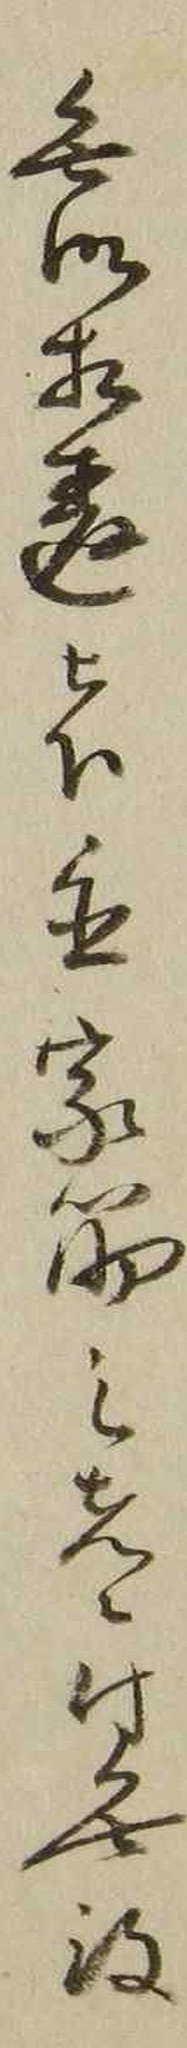無御相違被下置家筋之者に付無役
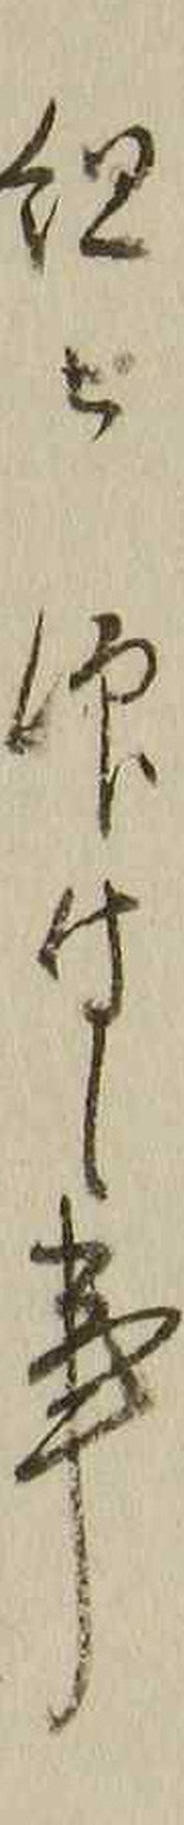組被仰付候事
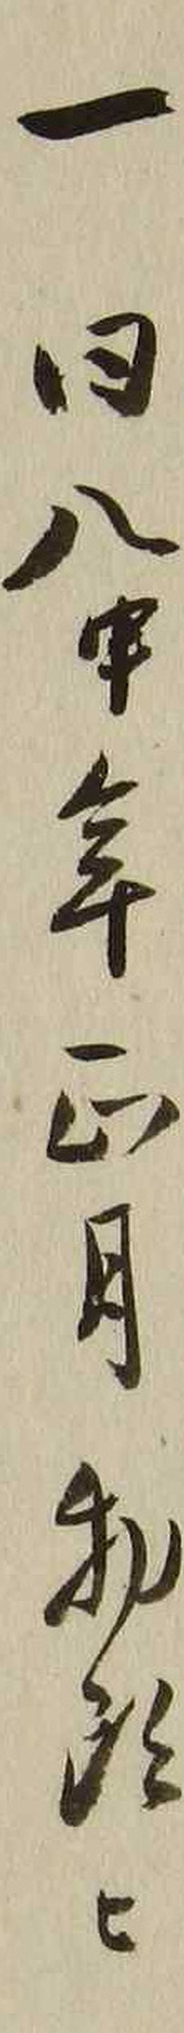一同八申年正月物頭被
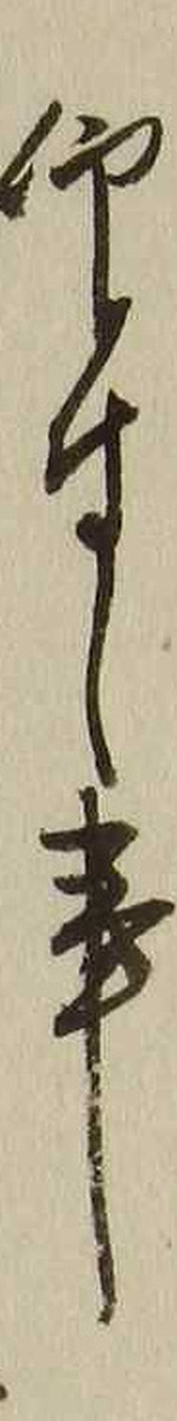仰付候事
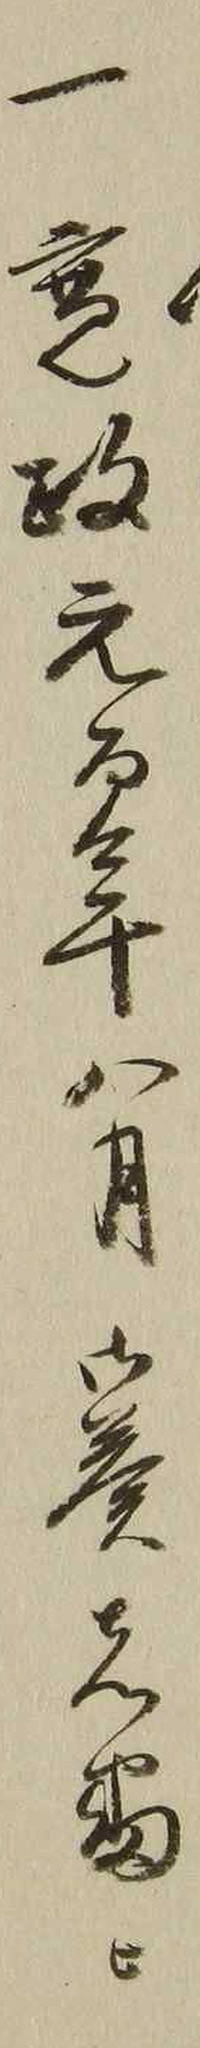一寛政元酉年八月御奏者番被
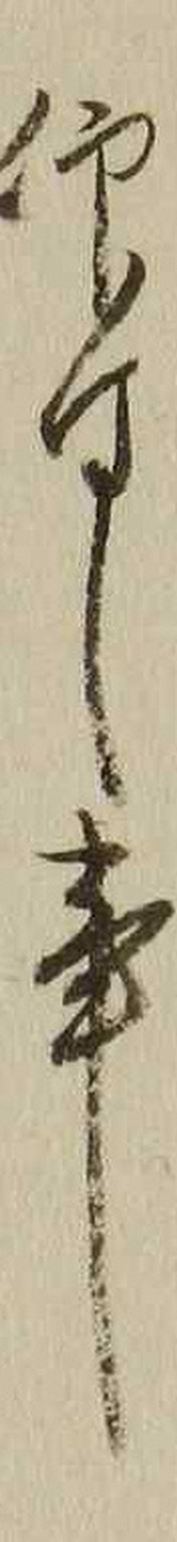仰付候事
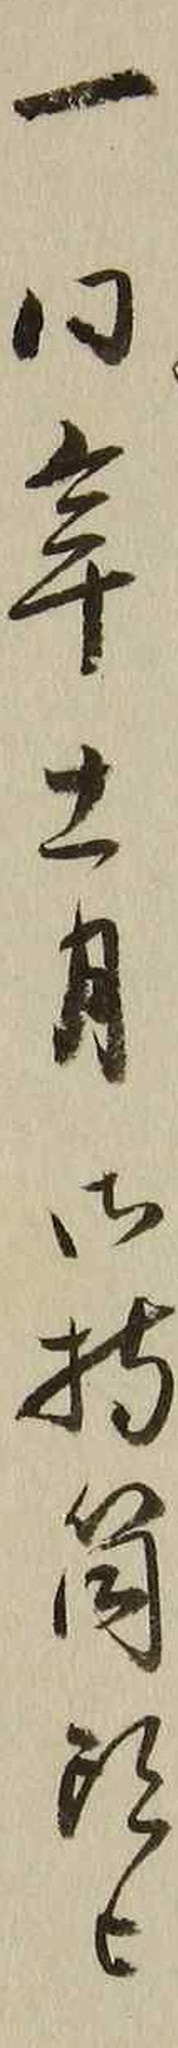一同年十一月御持筒頭被
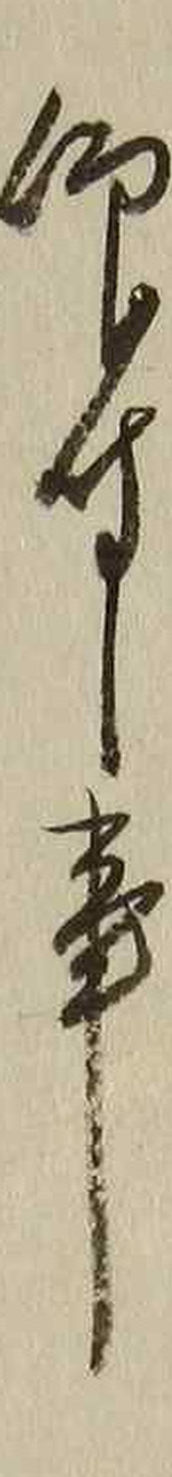仰付候事
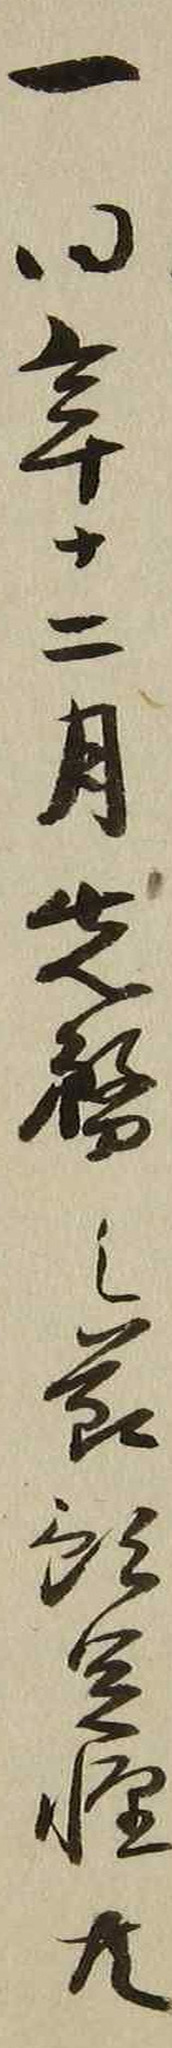一同年十二月先務之節預足軽共
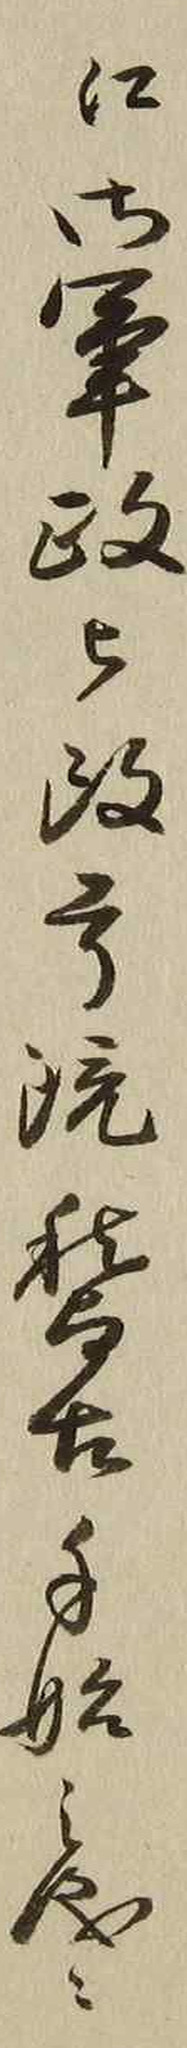江御軍政被改争銃稽古手始之儀に
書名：諸士系譜　巻之269　さ之部1
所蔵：会津若松市立会津図書館
